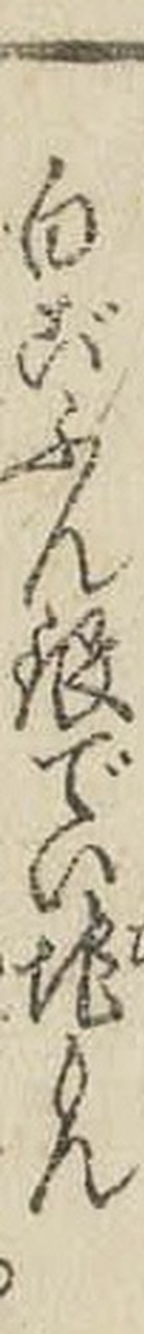白ごふん銀でい地もん
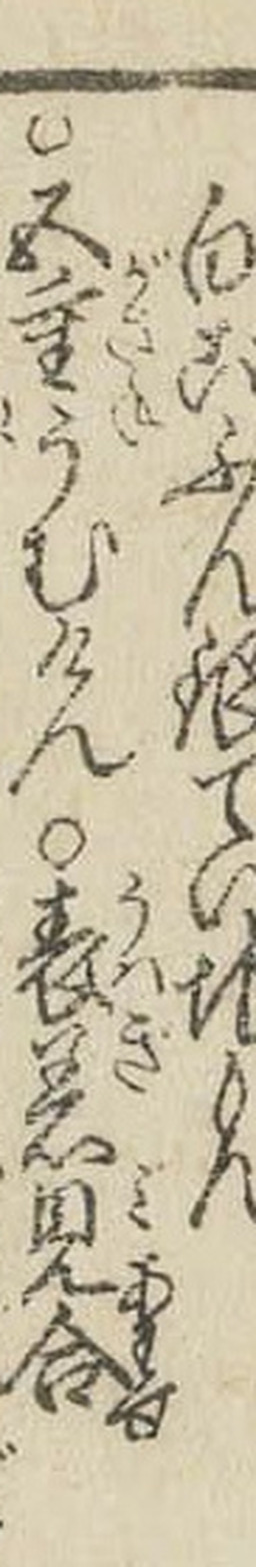○五重うむけん○表着見合
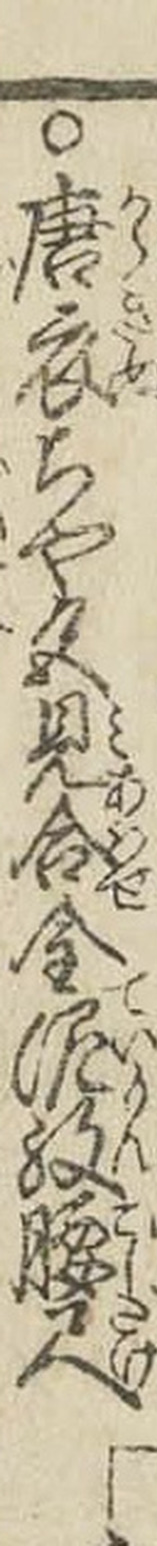○唐衣ちや色見合金泥紋腰尺
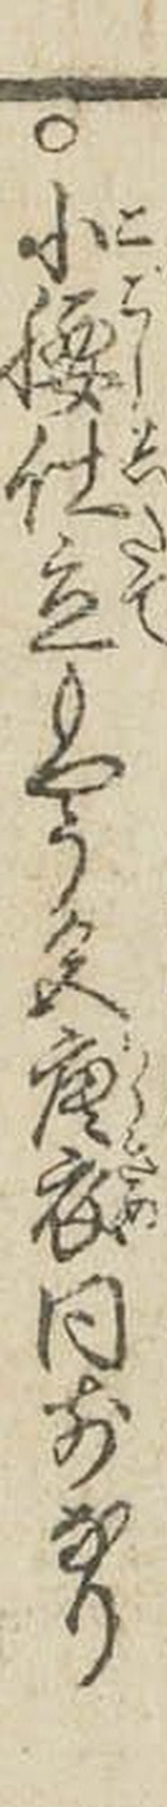○小腰仕立もやう色唐衣同前なり
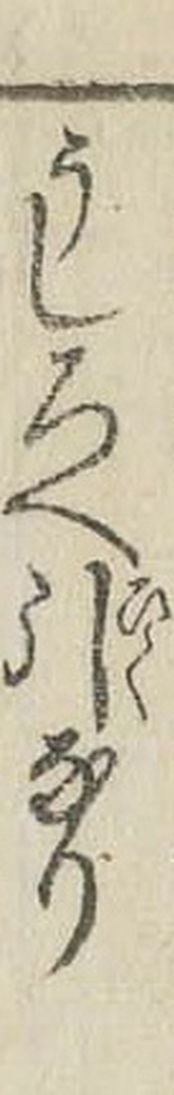うしろへ引なり
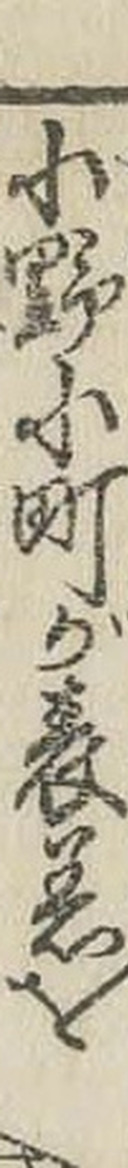小野小町が表着を
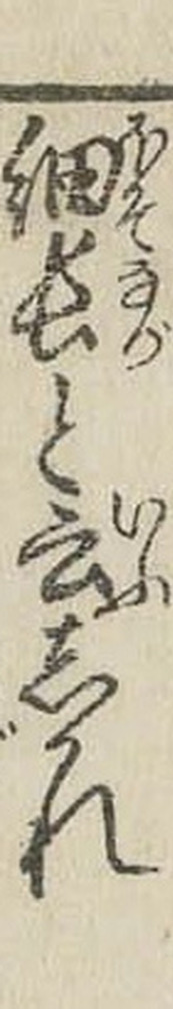細長と云しかれ
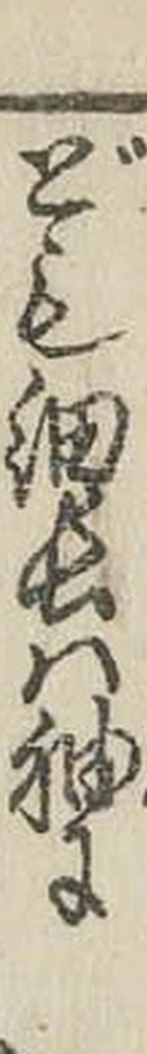ども細長は袖に
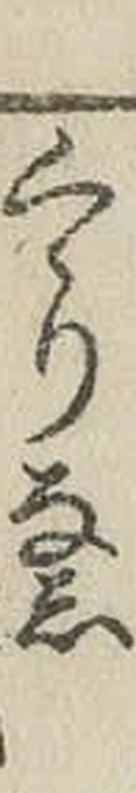くゝりなし
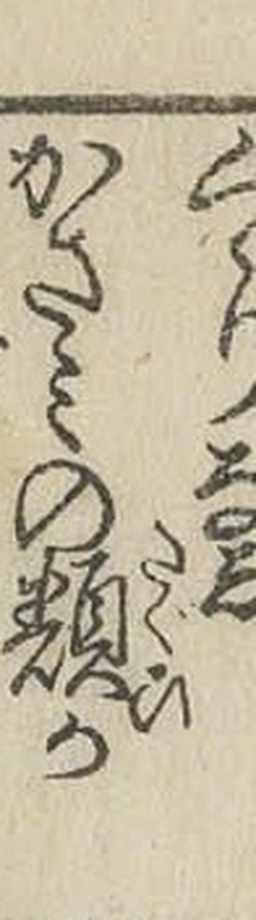かさみの類か
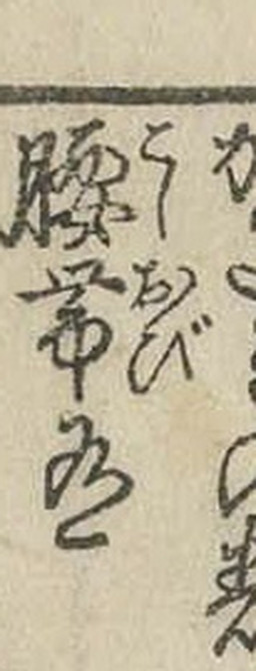腰帯有
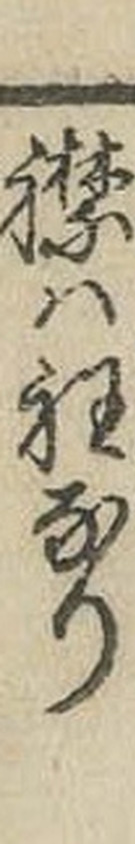襟は衽なり
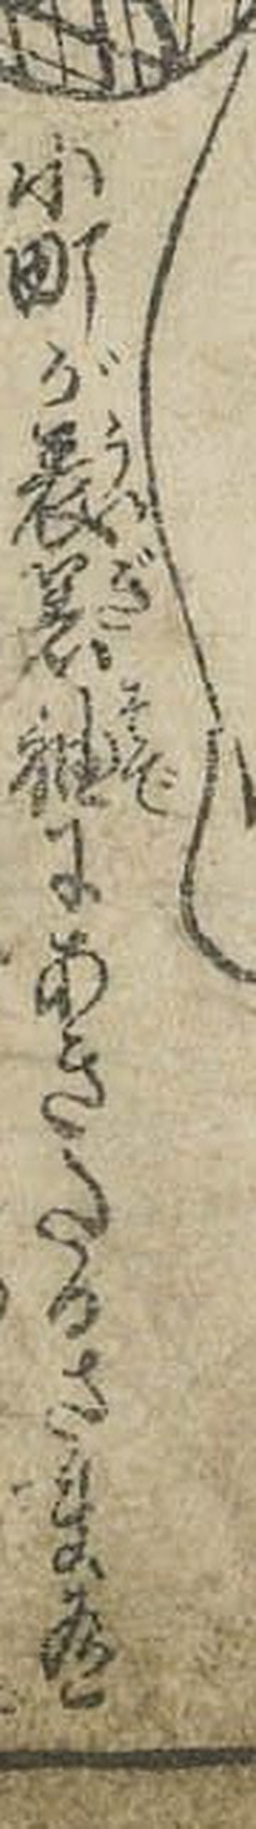小町が表着袖にあきたるさま有
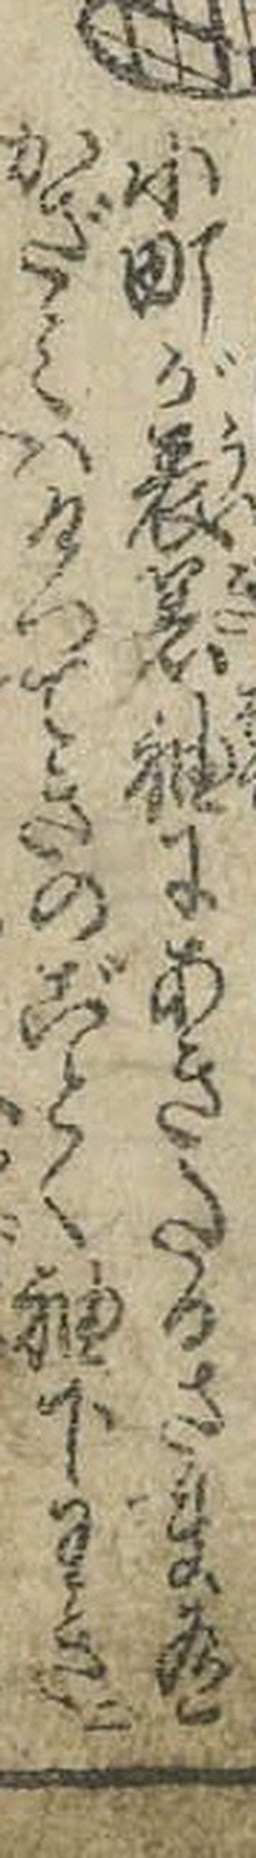かざみはけつてきのごとく袖下わき
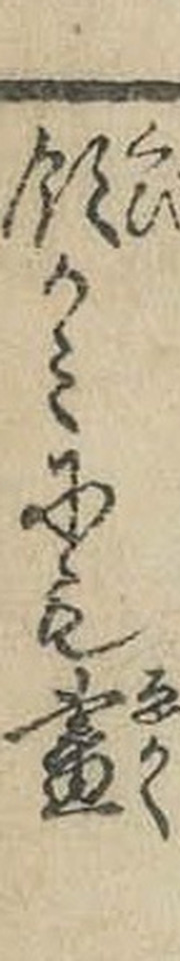領かみにも畫
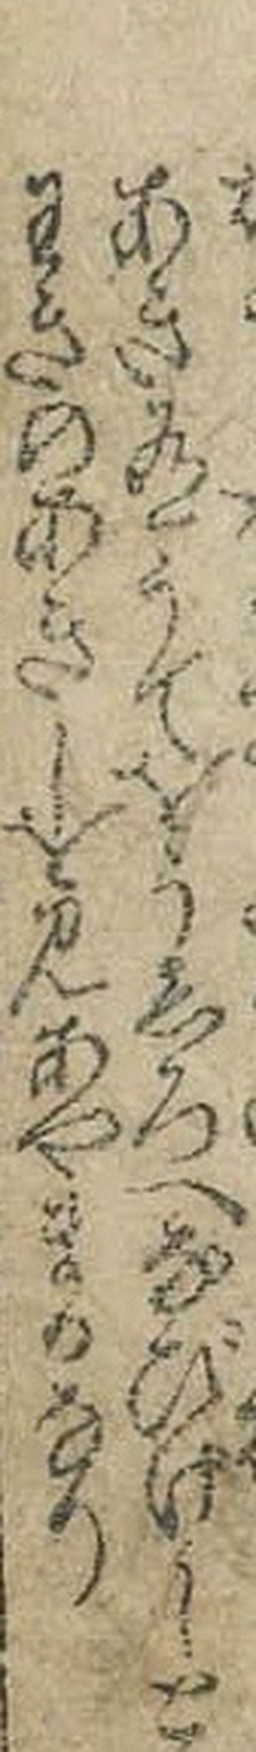わきのあきしを見あやまるなり
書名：絵本写宝袋 9巻 1之巻
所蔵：東京学芸大学教育コンテンツアーカイブ
